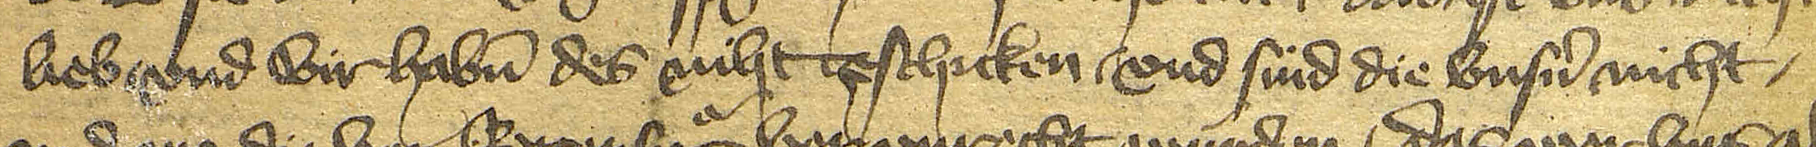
lieb / vnd wir habn* des niht cʒeſchicken / vnd ſind die vnſn* nicht /
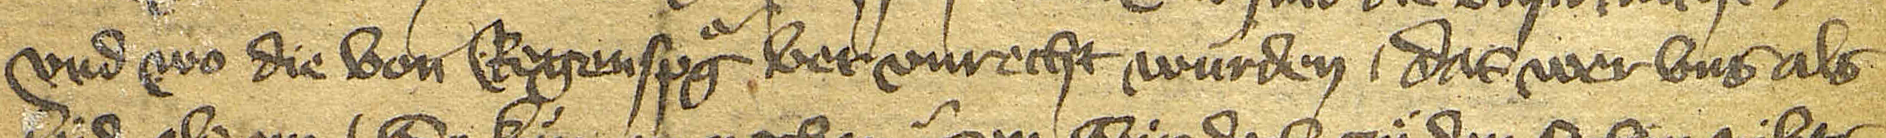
vnd wo die von Regenſp*g verunrecht würden / Das wer vns als
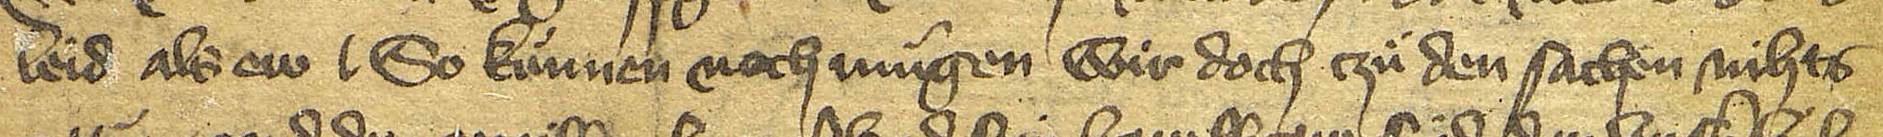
leid als ew / So künnen noch mügen wir doch cʒü den ſachen nihts
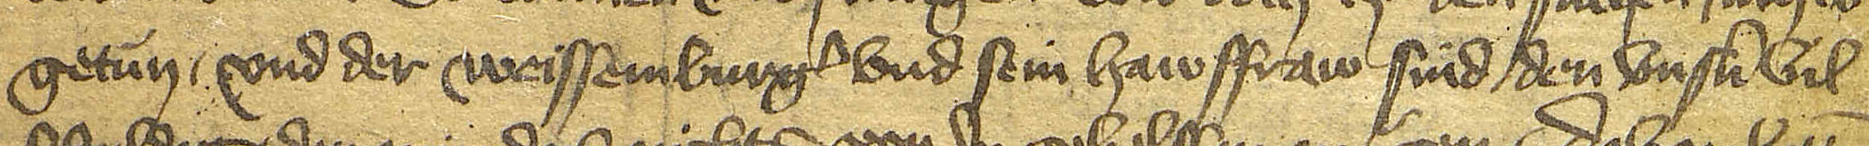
getün / vnd der weiſſemburg* vnd ſein hawſfraw ſind / den vnſn* vil
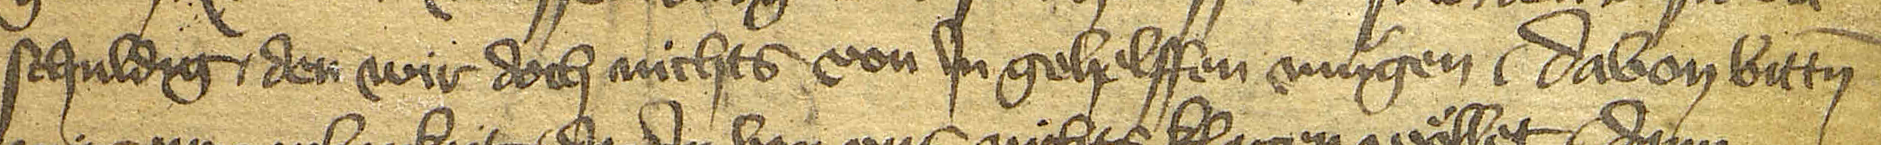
ſchuldig / den wir doch nichts von In gehelffen mügen / Davon bittn*
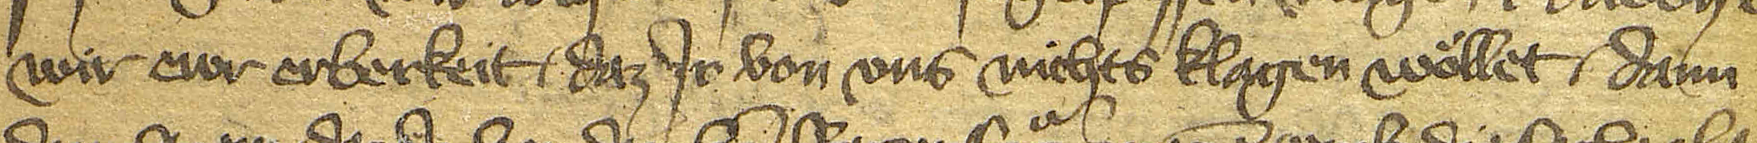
wir ewr erberkeit / daʒ Ir von vns nichts klagen wöllet / dann
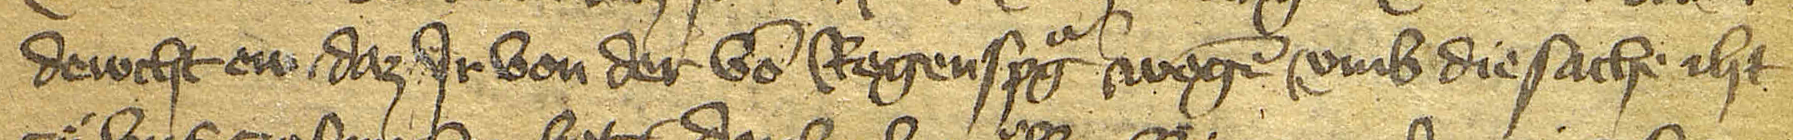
dewcht ew / daʒ Ir von der vo* Regenſp*g wege* / vmb die ſache iht
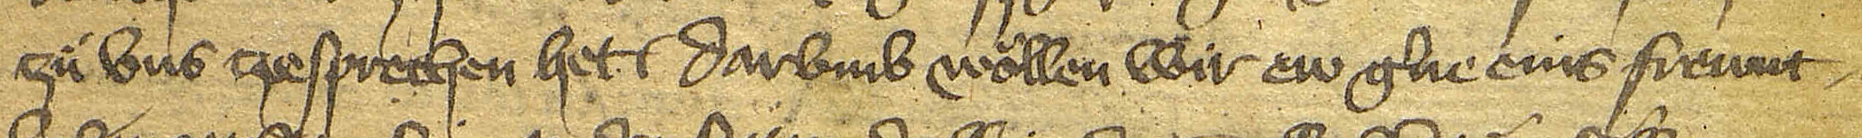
cʒü vns cʒeſprechen het / Darumb wöllen wir ew g*ne eins frewnt
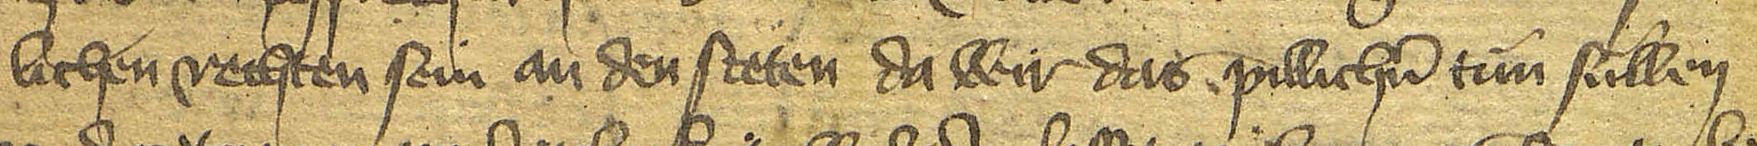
lichen rechten ſein an den ſteten da wir das pillichn* tün ſüllen
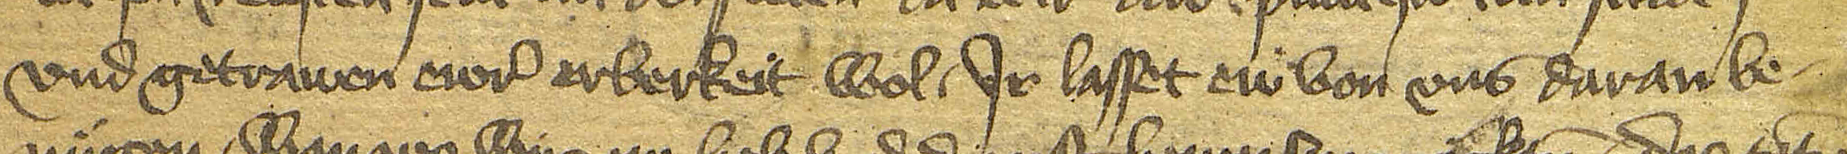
vnd getrawen ewr* erberkeit wol / Ir laſſet ew von vns daran be -
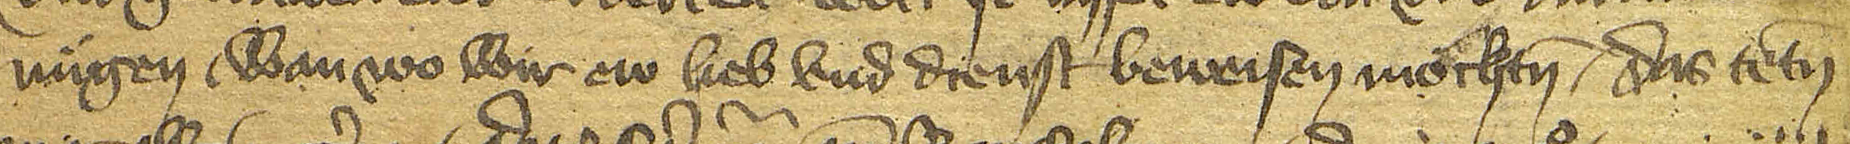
nügen / wan wo wir ew lieb vnd dienſt beweiſen möchtn* / Das tetn*
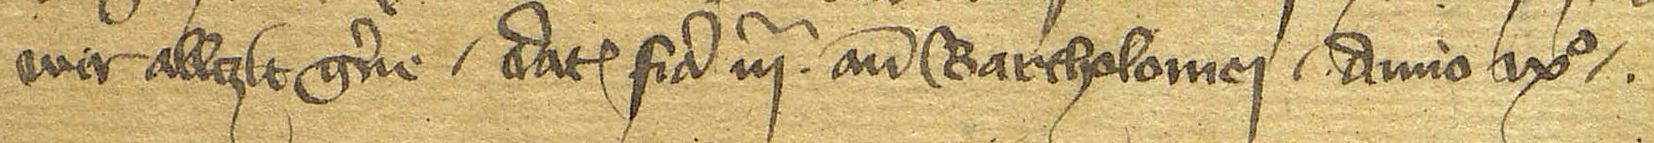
wir allcʒ*t g*ne / Dat fia* iii* . an* Bartholomei / Anno ix* / .
